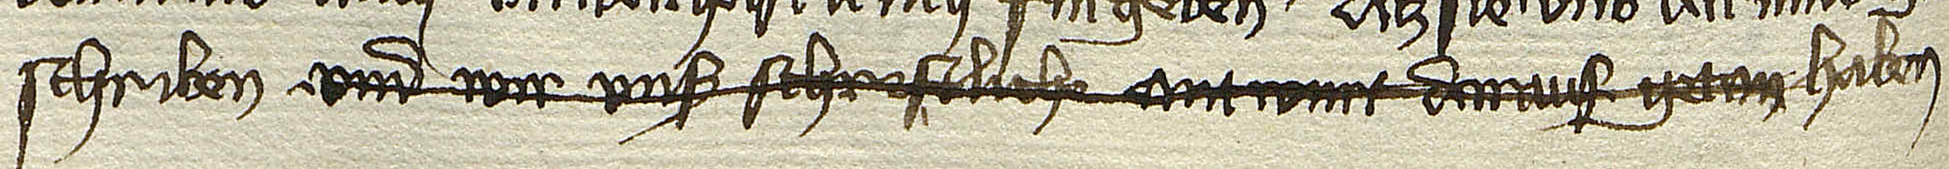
ſchriben vnd wir vnſ* ſchriftliche antwurt darauf getan haben
